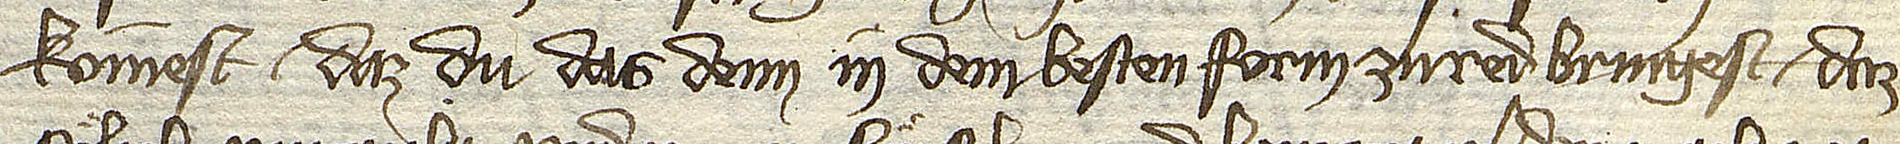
komeſt* / daʒ du das denn in dem beſten form ʒured bringeſt / daʒ
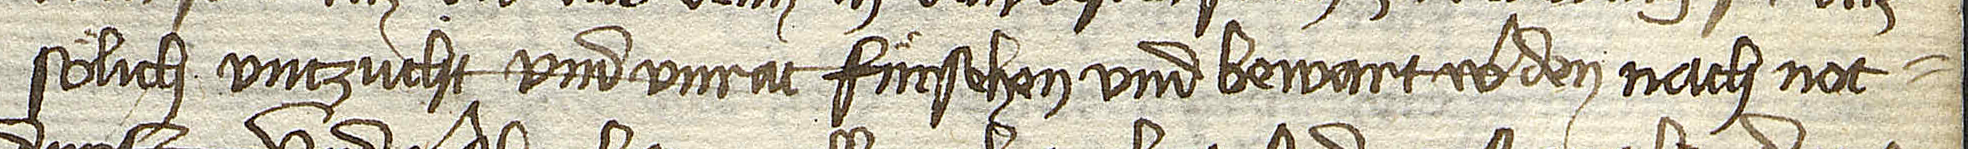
ſölich vncʒucht vnd vnrat fürſehen vnd bewart w*den nach not =
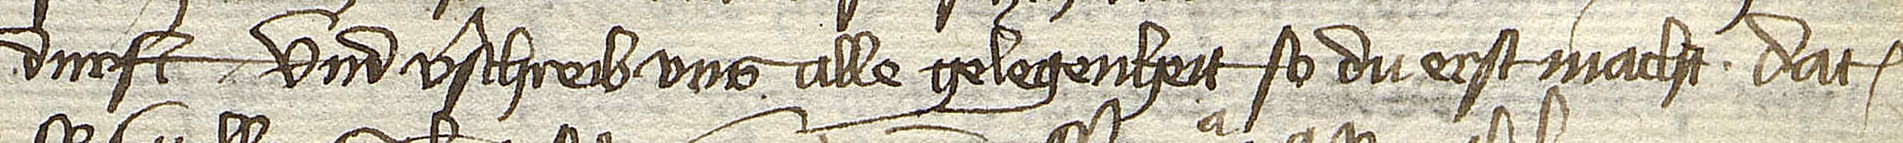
durft / Vnd v*ſchreib vns alle gelegenheit ſo du erſt macht . dat*
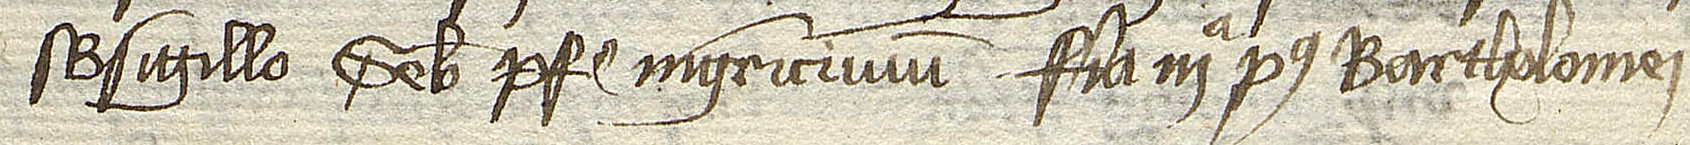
ſB ſigillo Seb* Pf* mgriciuiu* . fia* iii* p* Bartholomei
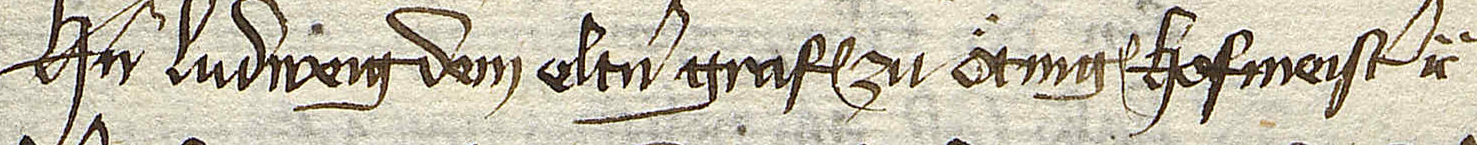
Hn* ludwerg dem eltn* graf* ʒu öting* hofmeiſt* ec*
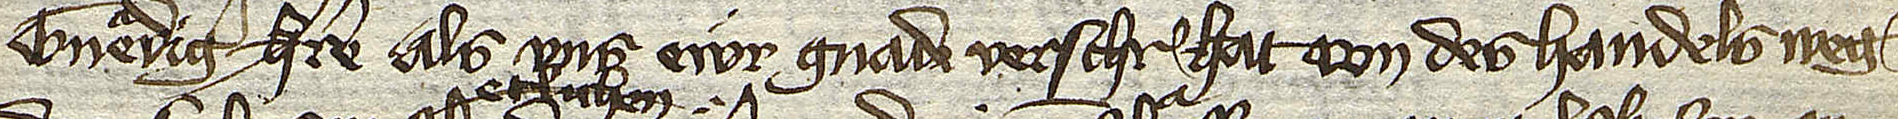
Gnëdig* hre* als vns ewr gnad verſchr* hat von des handels weg*
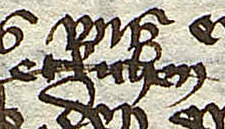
etlichen
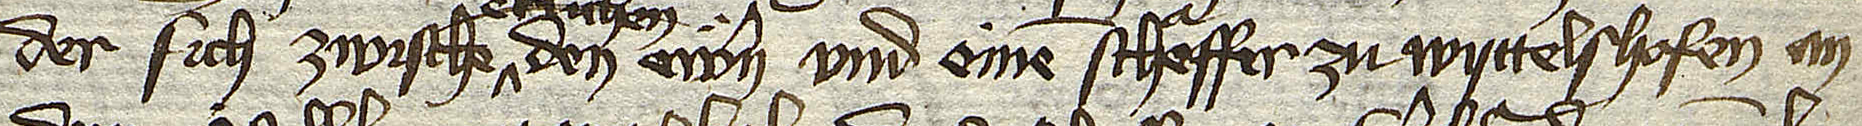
der ſich ʒwiſche* den ew*n vnd eine* ſchëffer ʒu wyttelſhofen an
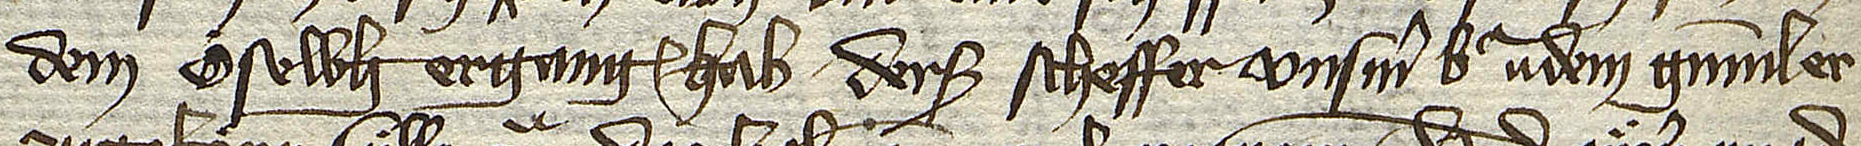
dem öſelbg* ergang* hab / Derſ* ſcheffer vnſ*m b* ~ dem gumler*
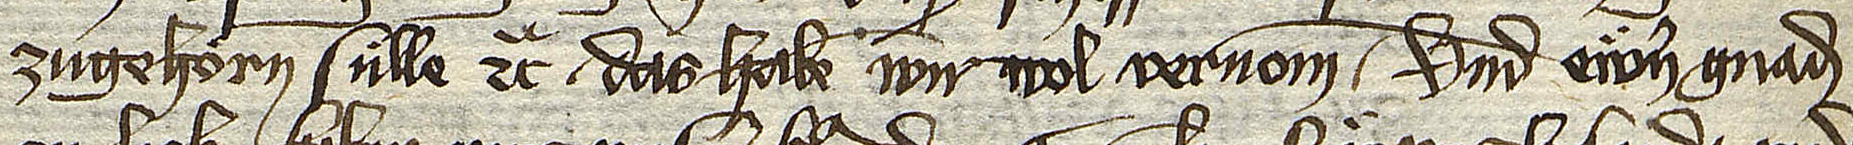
ʒugehörn ſülle ec* / das habe* wir wol vernom* / Vnd ew*n gnad*
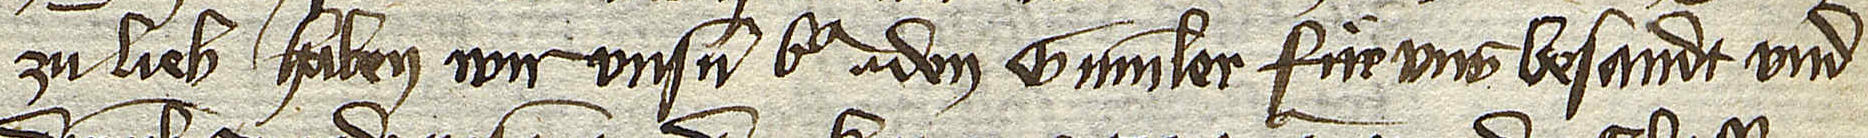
ʒu lieb haben wir vnſ*n b* ~ den Gumler für vns beſandt vnd
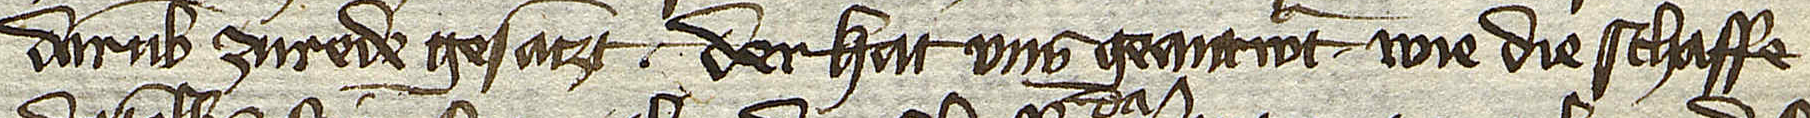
darub* ʒurede geſacʒt . Der hat vns geantw*t . wie die ſchaffe
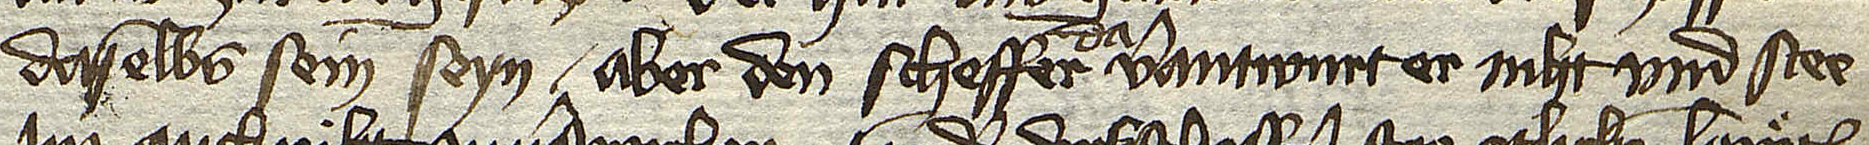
daſelbs ſein ſeyn / aber den ſcheffer v*antwurt er niht vnd ſtee
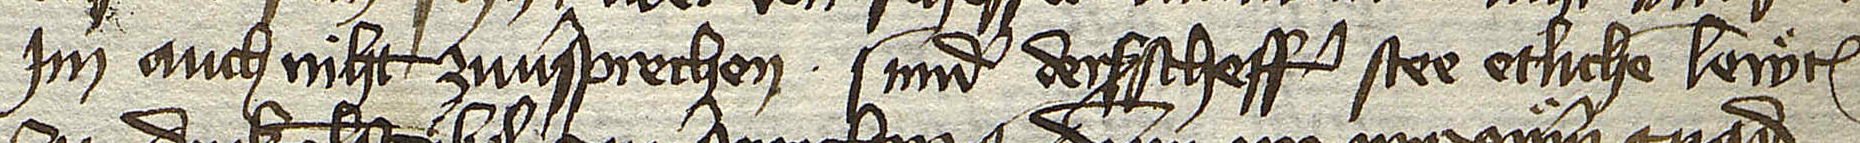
Im auch niht ʒuu*ſprechen . ſund* derſ* ſcheff* ſtee etliche* lewt*
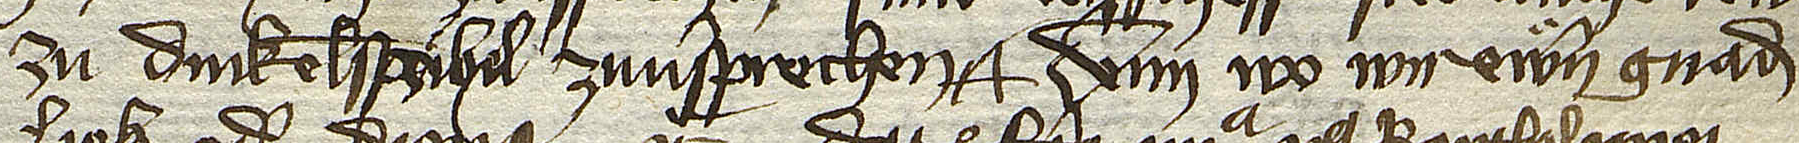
ʒu dinkelſpübel ʒuu*ſprechen Denn wo wir ewn* gnad*
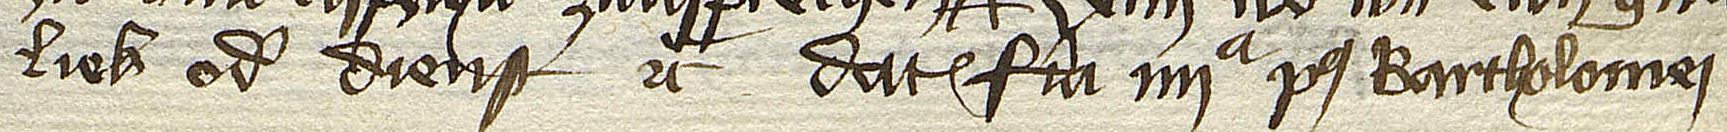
lieb od* dienſt ec* dat* fia* iiii* p* Bartholomei
